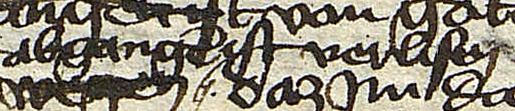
abgange* iſt verliſen
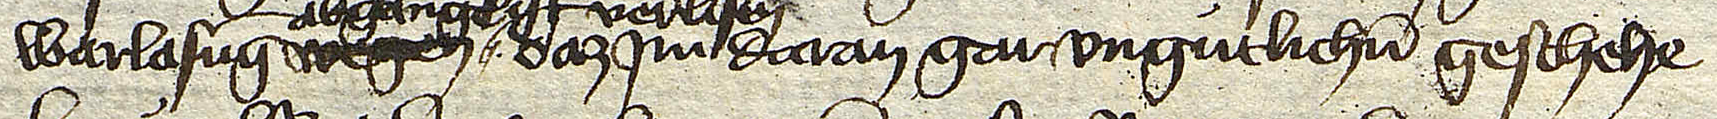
warlaſu*g wegen daʒ Im daran gar vngütlich*n geſchehe
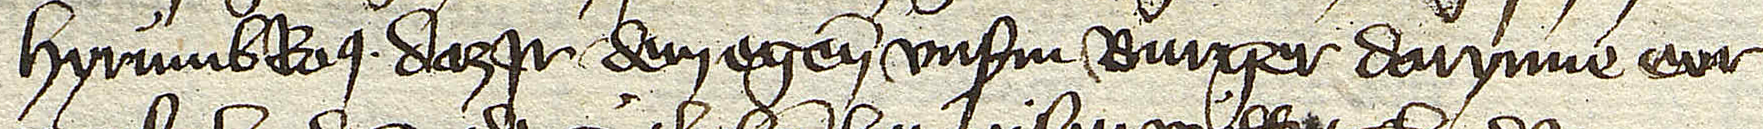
Hyrümb Ro* . daʒ Ir / dem egen* vnſ*m Burger darynne ewr
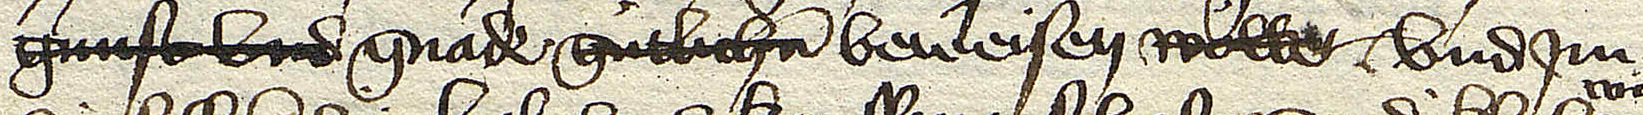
gunſt vnd gnade gütlich*n beweiſen wöllet / vnd Im
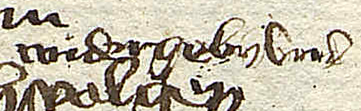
widergeb*n vnd
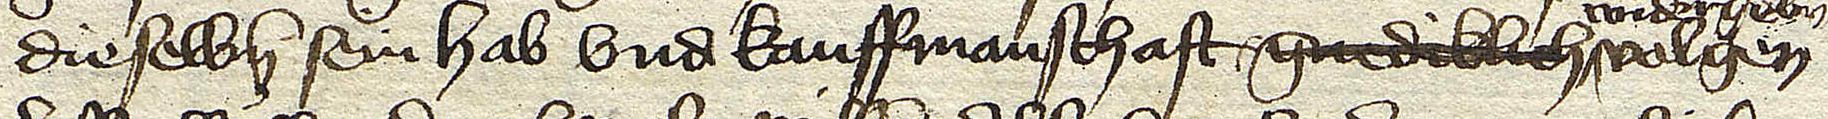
dieſelbn* ſein hab vnd kauffmanſchaft / gnediklich volgen
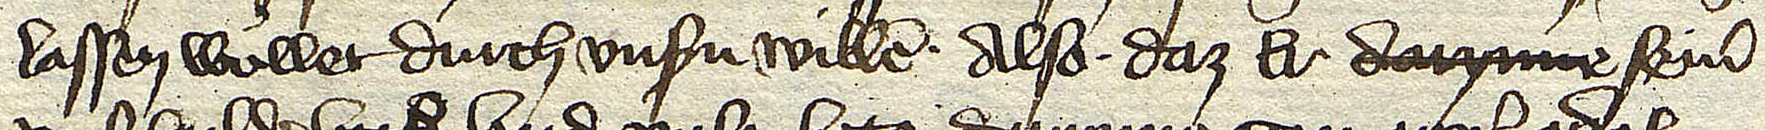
laſſen wöllet durch vnſ*n wille* . Alſo . daʒ Er darynne ſein*
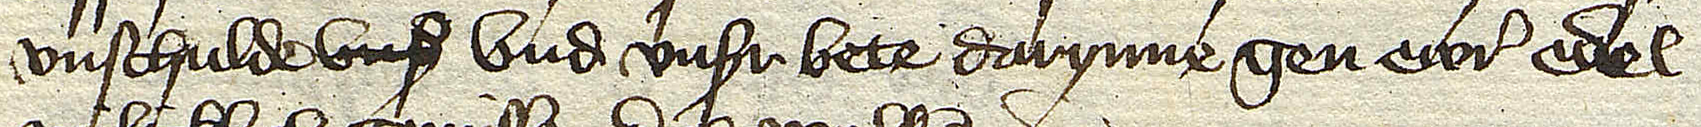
vnſchulde vnſ* vnd vnſ*r bete darynne gen ew*r edel
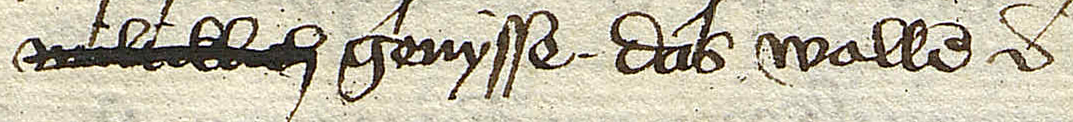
wilicklich genyſſe . das wolle* ec*
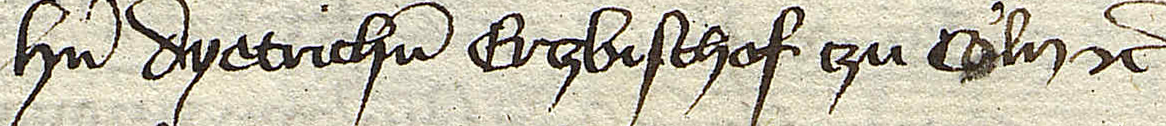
h*n dyetrich*n Ercʒbiſchof cʒu Cöln ec*
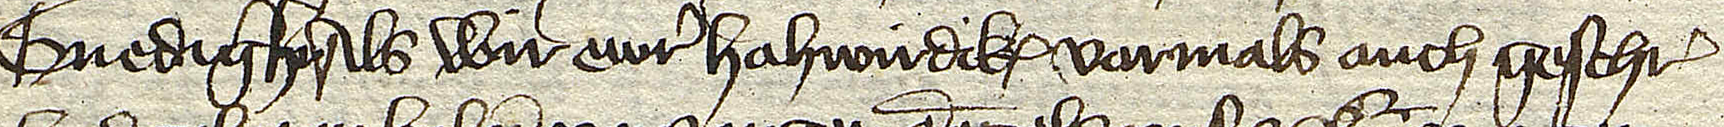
Gnedig* h*r Als wir ew*r hohwirdik* vormals auch geſchr*
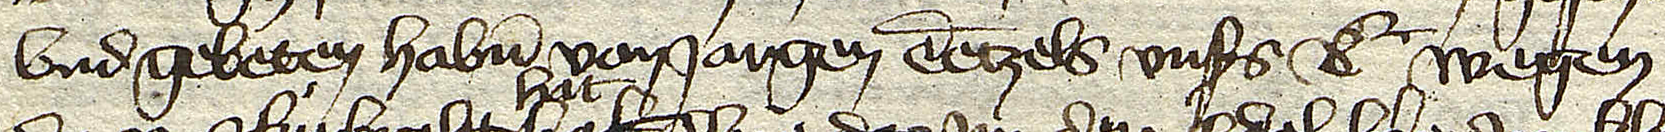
vnd gebeten hab*n von Iorgen Tecʒels vnſ*s B* wegen
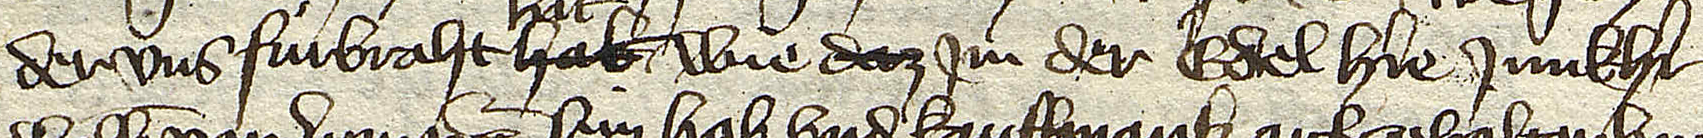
der vns fürbraht hab / wie daʒ Im der Edel h*re Iunkh*r
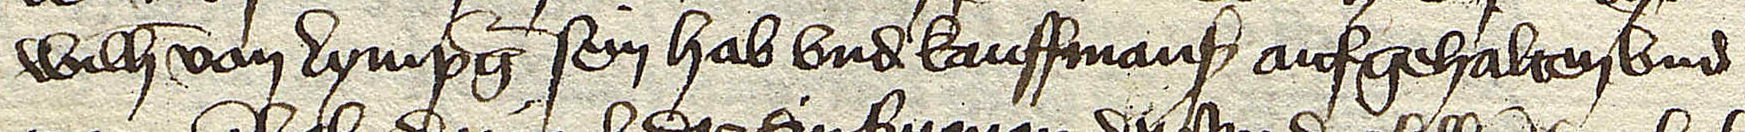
Wilh* von Lymp*g ſein hab vnd kauffmanſ* aufgehalten vnd
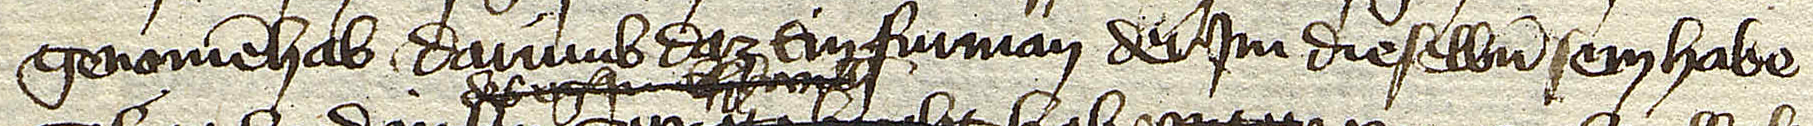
genome* hab / darümb daʒ Ein furman der Im dieſelb*n ſein habe
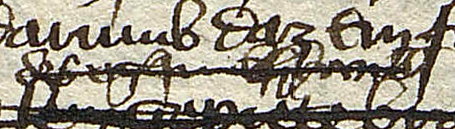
des eg* Iunkhn* wilh*
